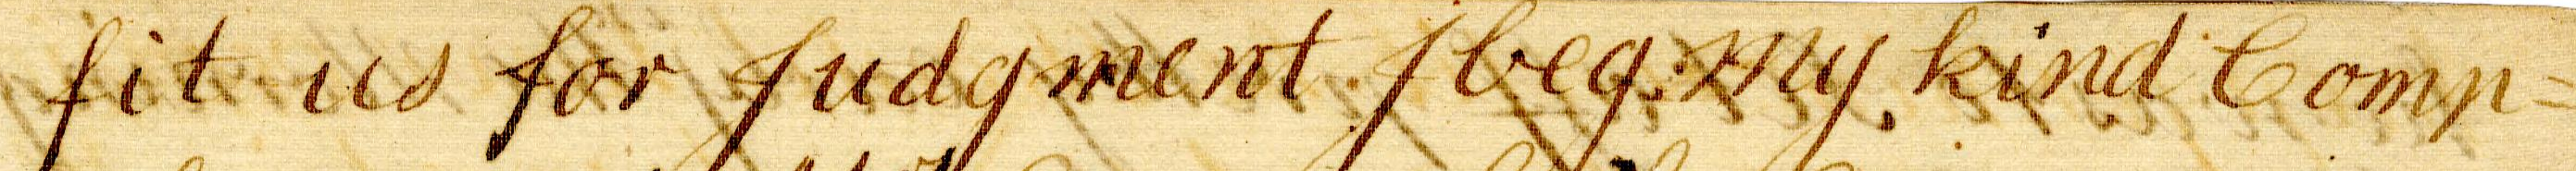fit us for Judgement. I beg my kind Comp-
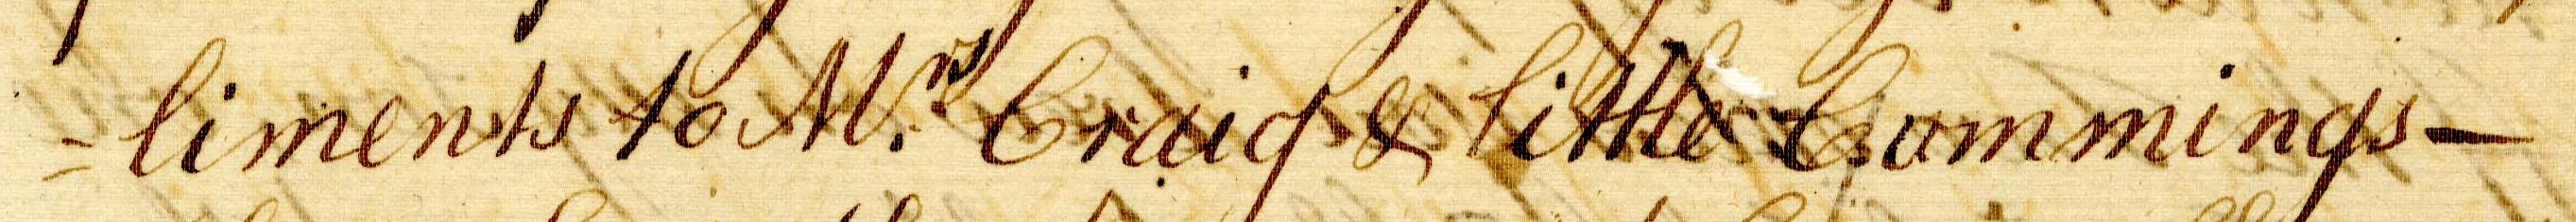-liments to M^rs. Craig & little Cummings-
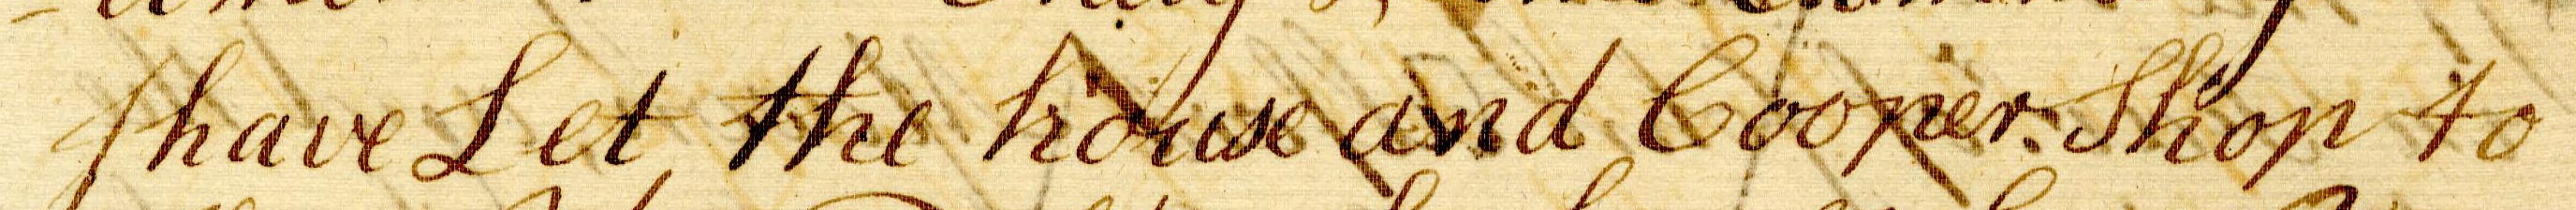I have Let the house and Cooper Shop to
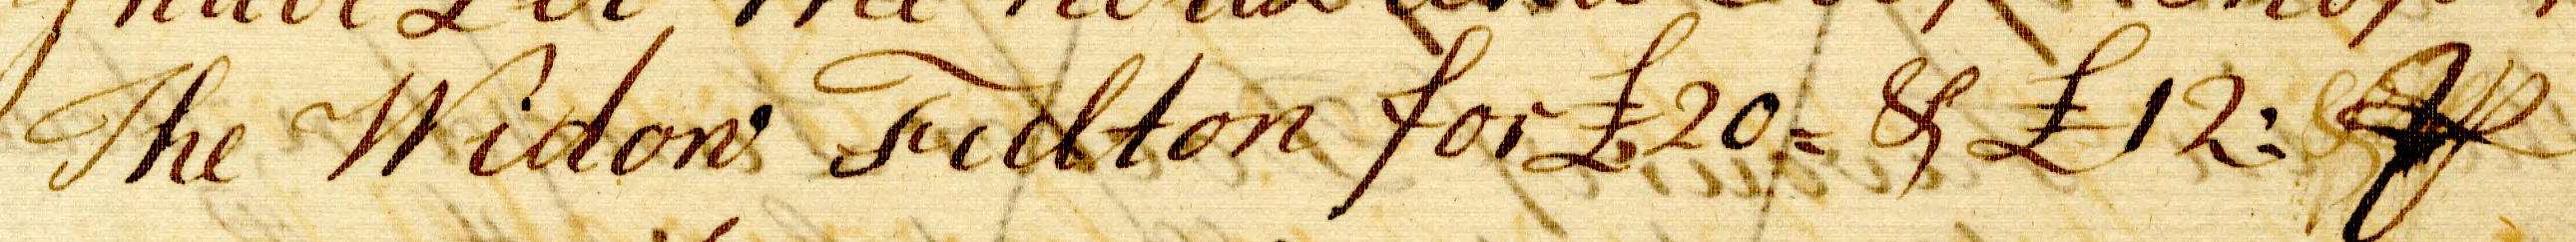The Widows Fulton for £20: & £12: per
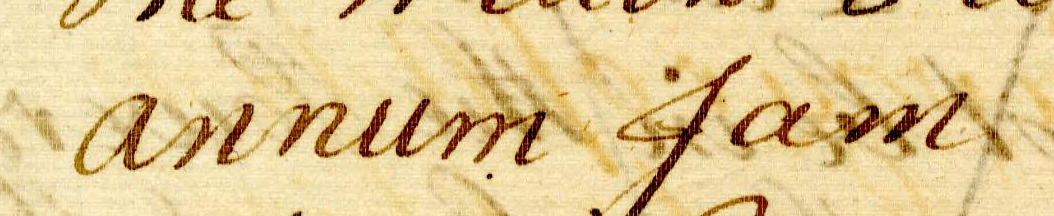annum I am
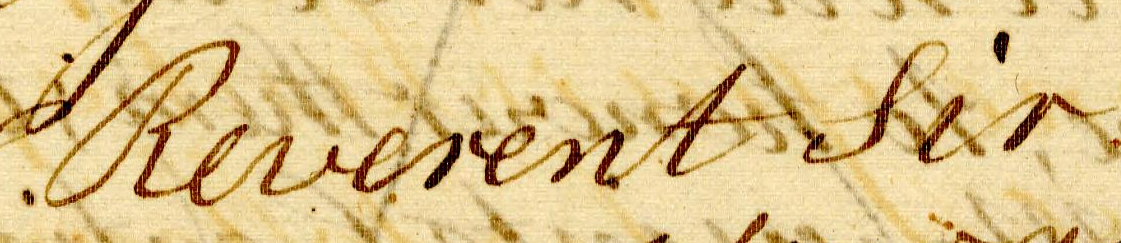Reverent Sir
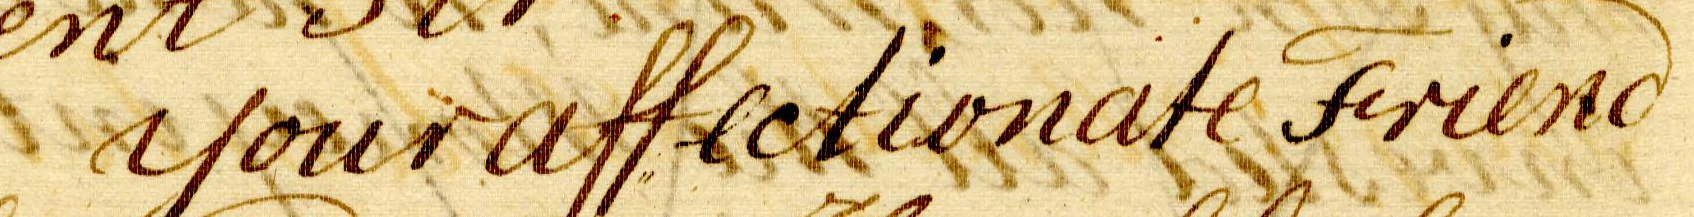Your affectionate Friend
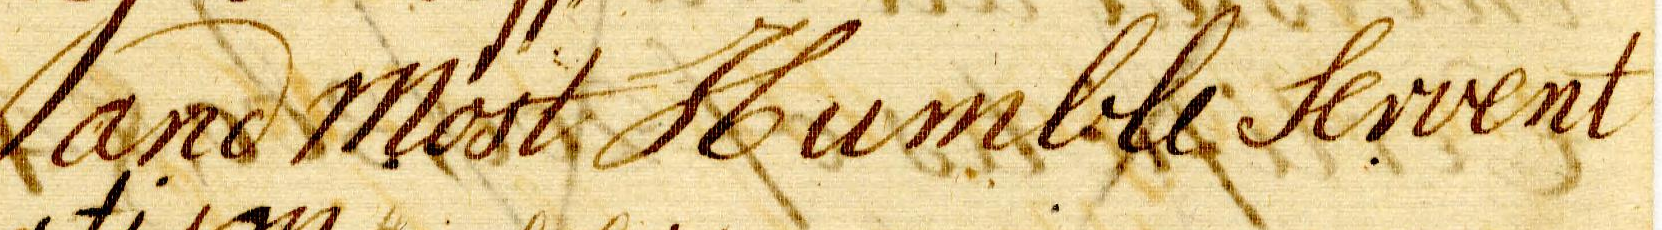and Most Humble Servent
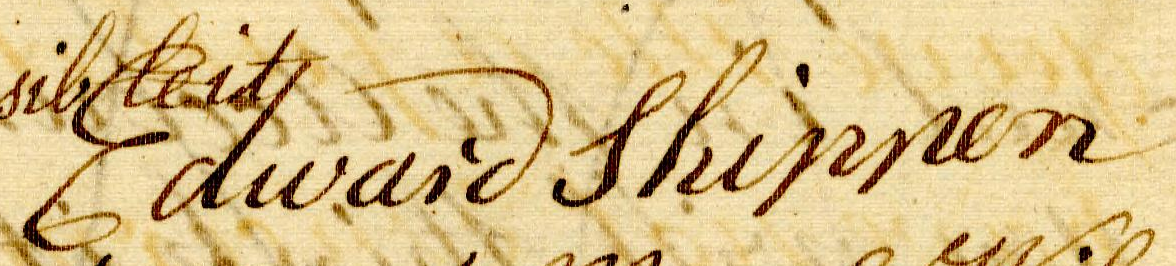Edward Shippen
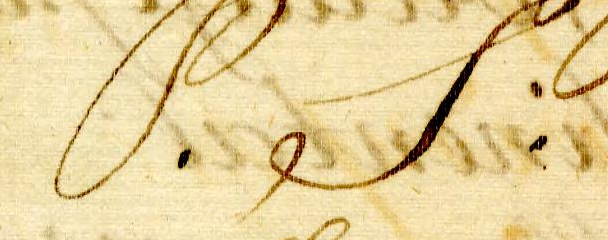P. S:
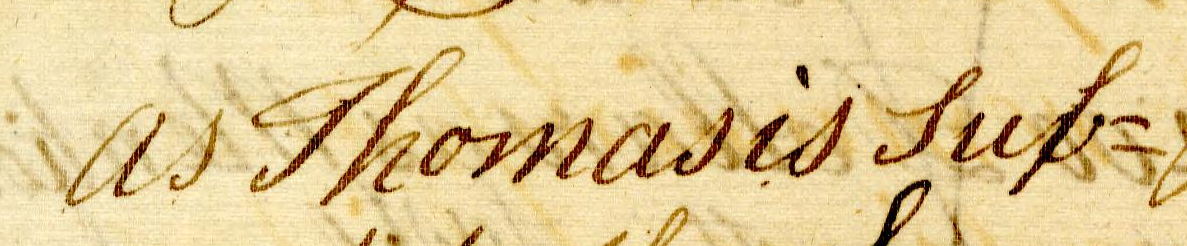As Thomas is Suss-
